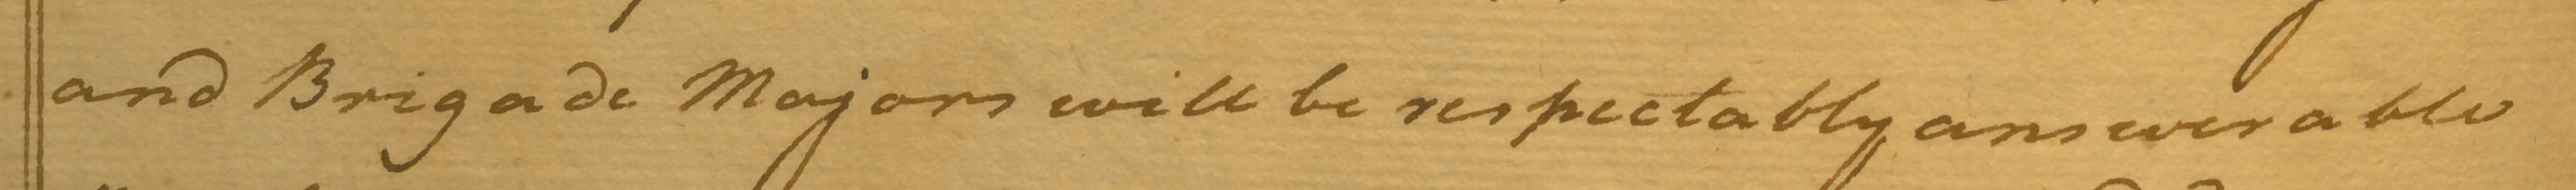and Brigade Majors will be respectably answerable
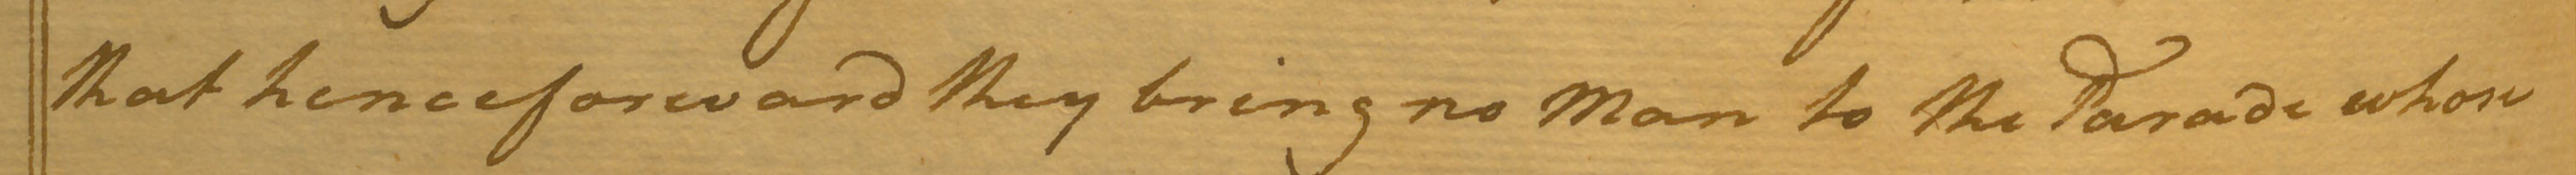that henceforward they bring no Man to the Parade whose
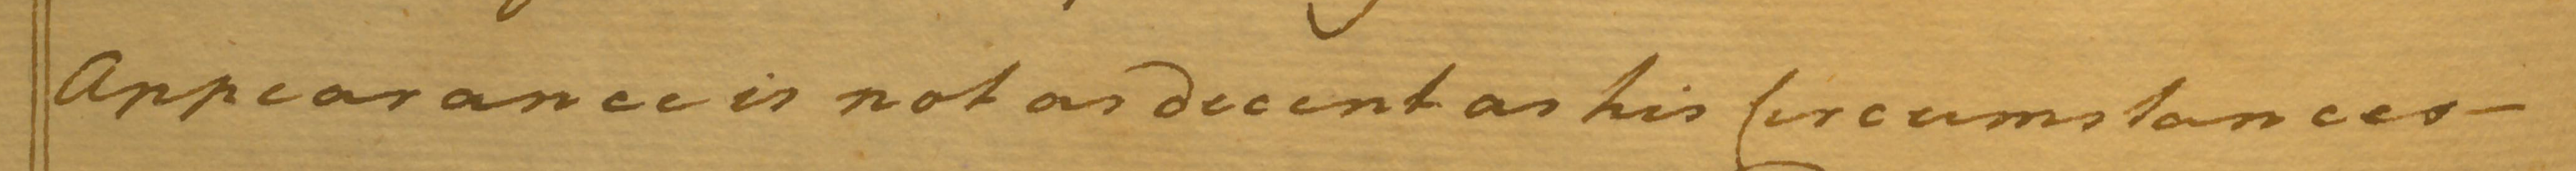Appearance is not as decent as his Circumstances-
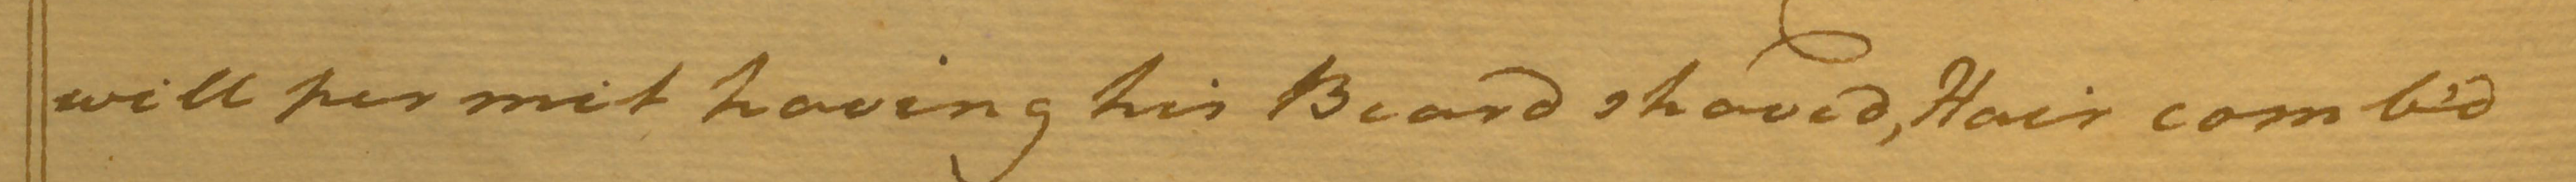will permit having his Beard shaved, Hair comb'd
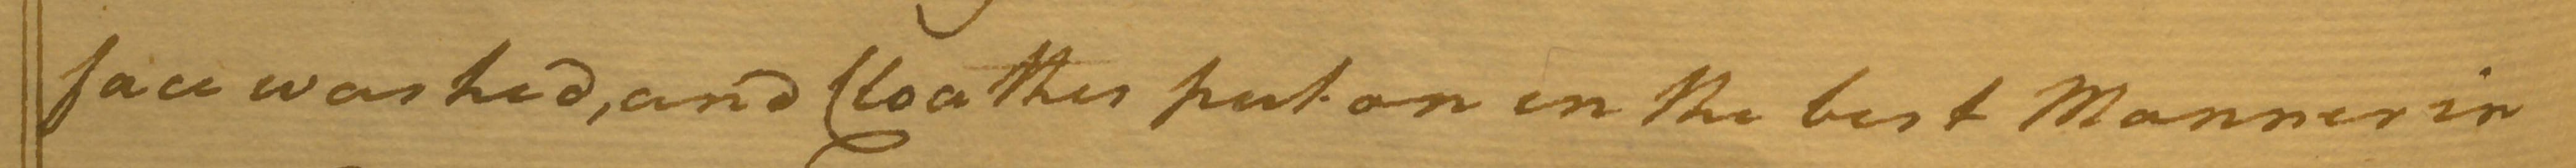face washed, and Cloathes put on in the best Manner in
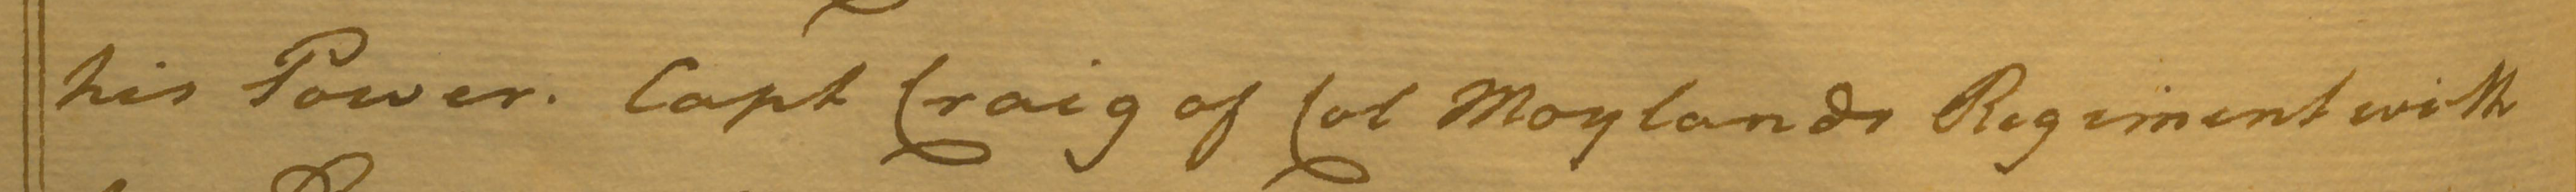his Power. Capt Craig of Col Moylands Regiment with
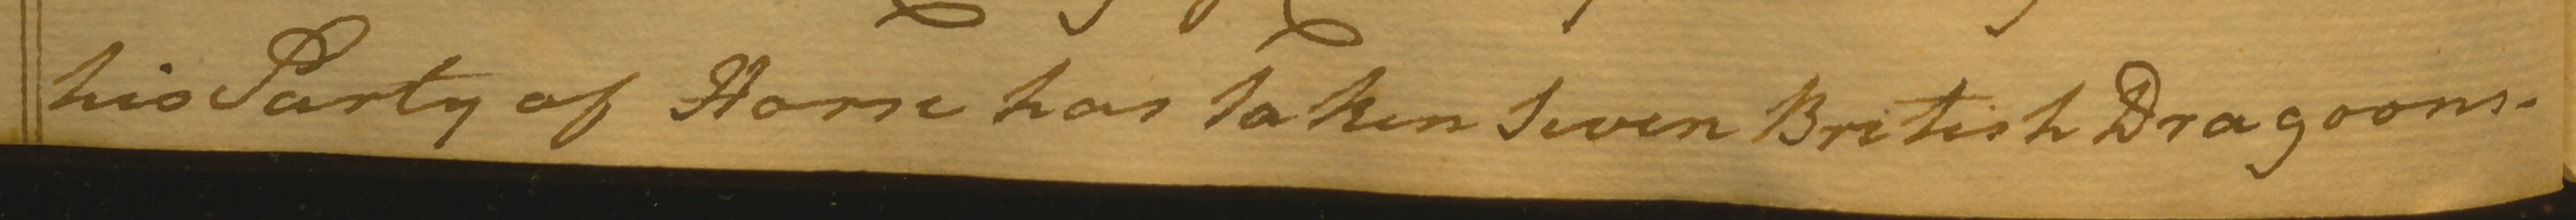his Party of Horse has taken seven British Dragoons
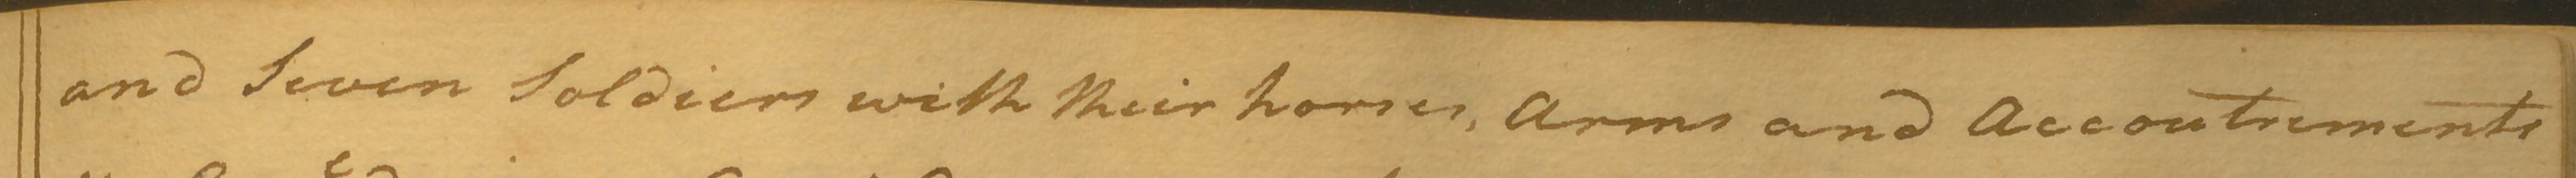and Seven Soldiers with their horses, Arms and Accoutrements
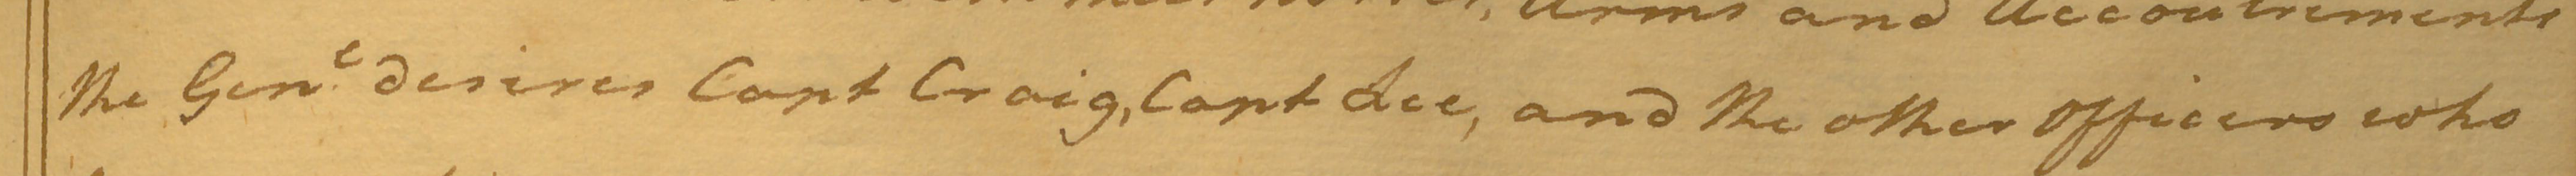the Gen^l. desires Capt Craig, Capt Lee, and the other officers who
